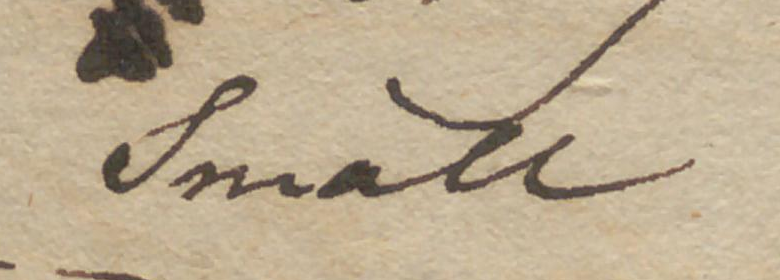Small
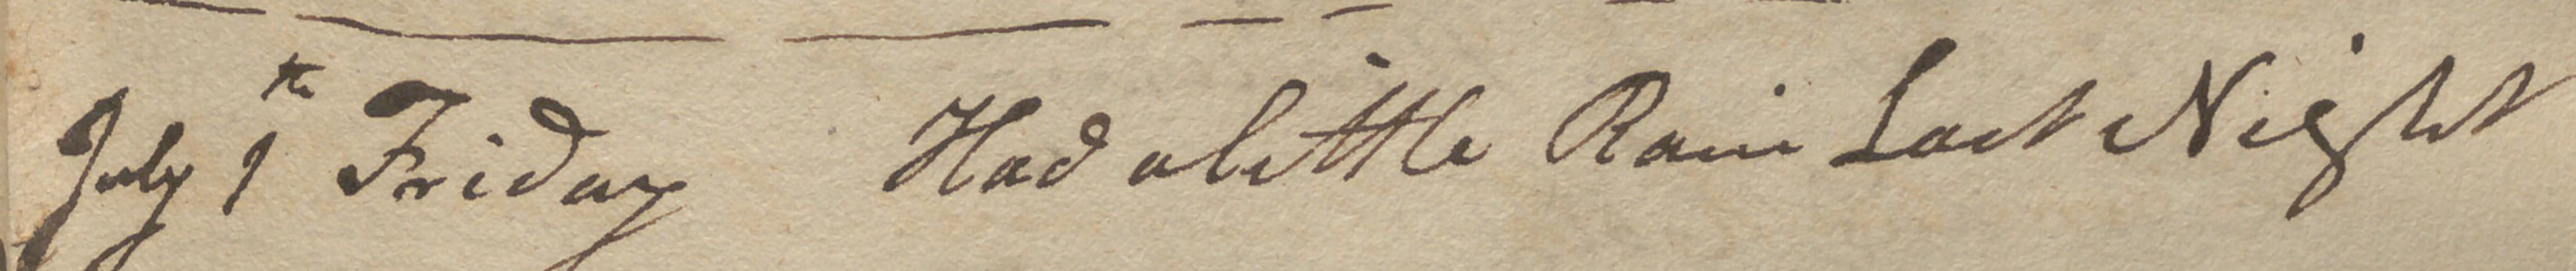July 1^th Friday Had a little Rain Last Night
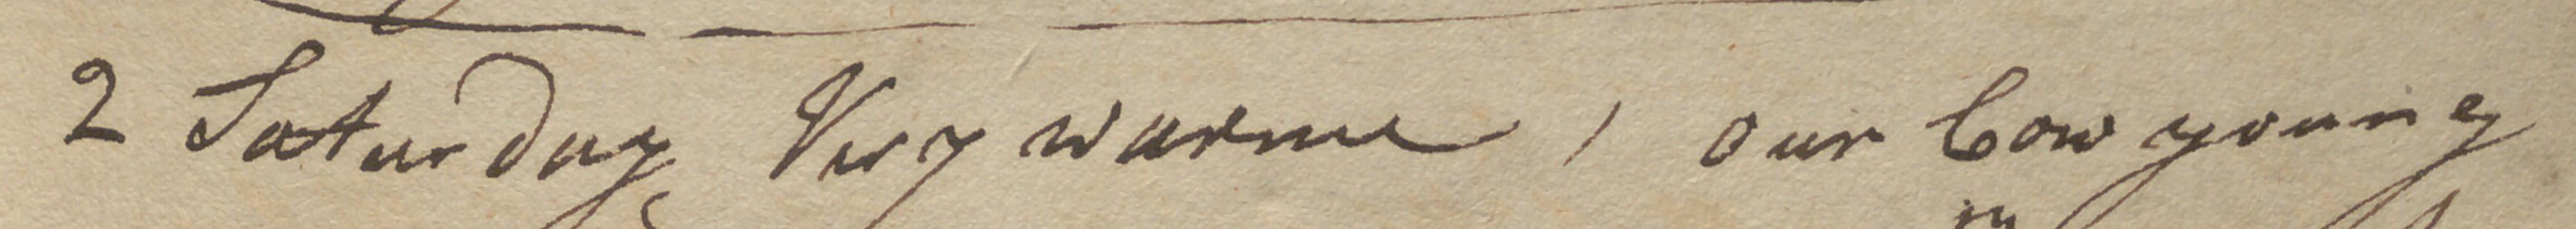2 Saturday Very warme, our Cow young
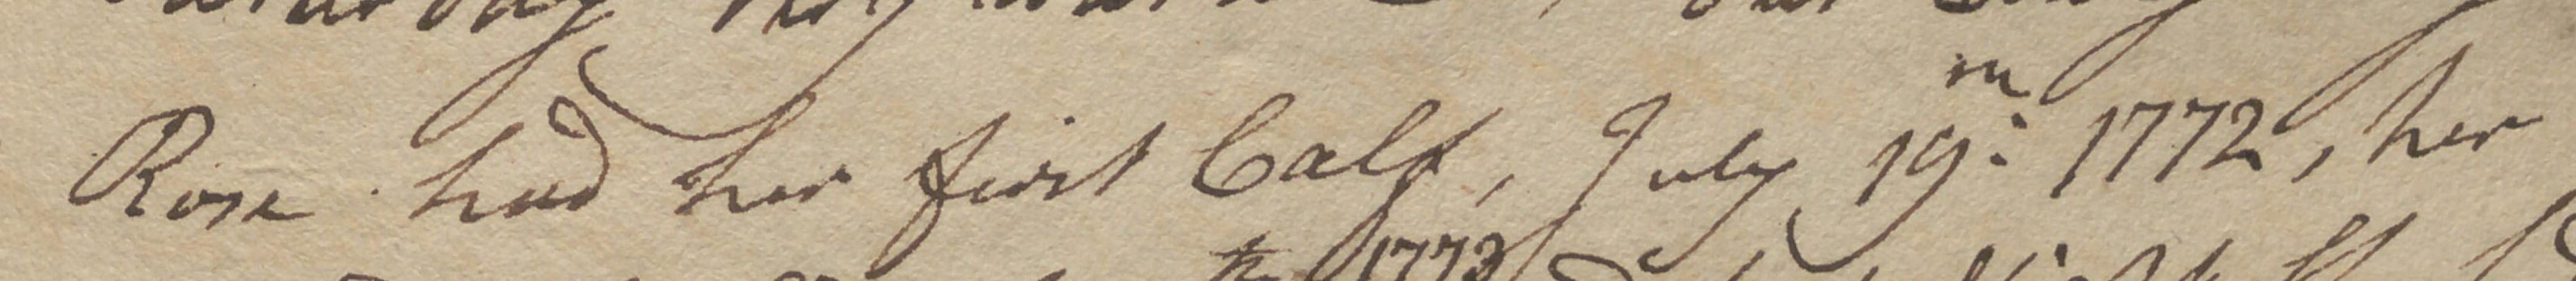Rose had her firdt Calf, July 19^th. 1772, her
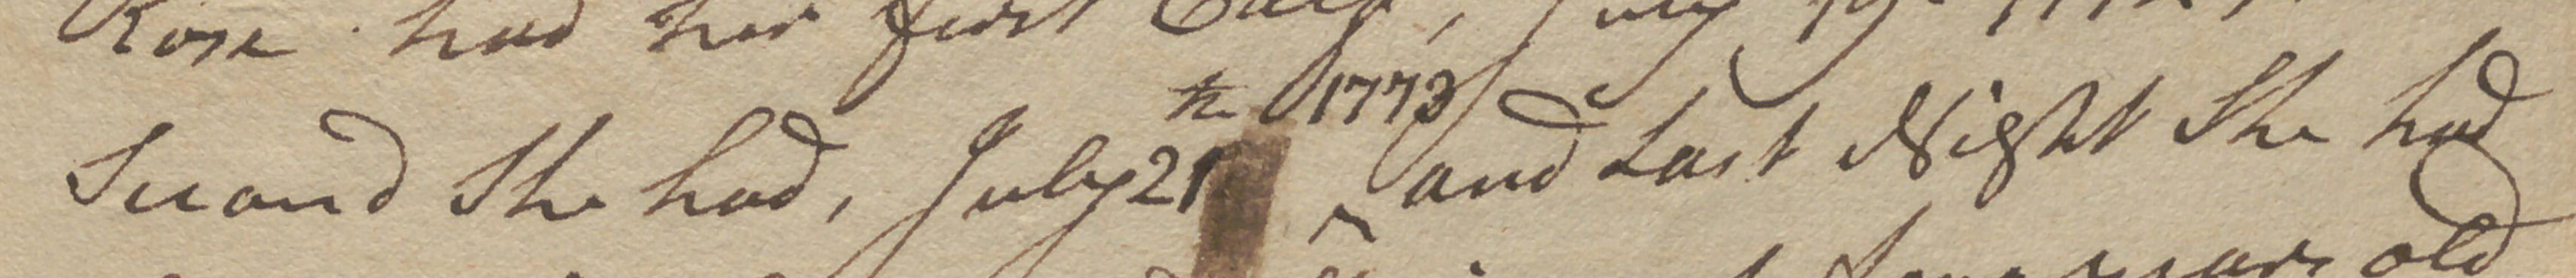second she had, July 21^th ^ and Last Night she had
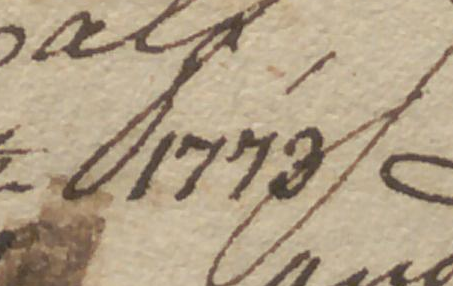1773
